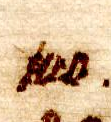100.
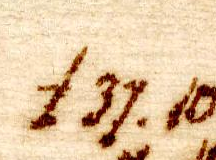£37.10
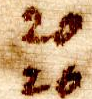20
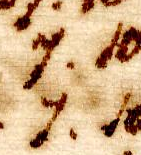7.10
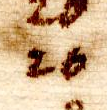20
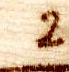2
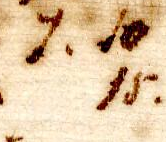7.10
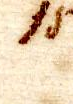15.
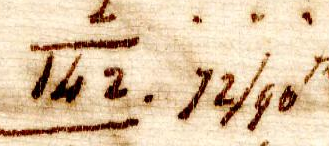142.72/90^th
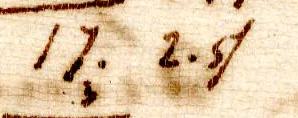17.2.5s
